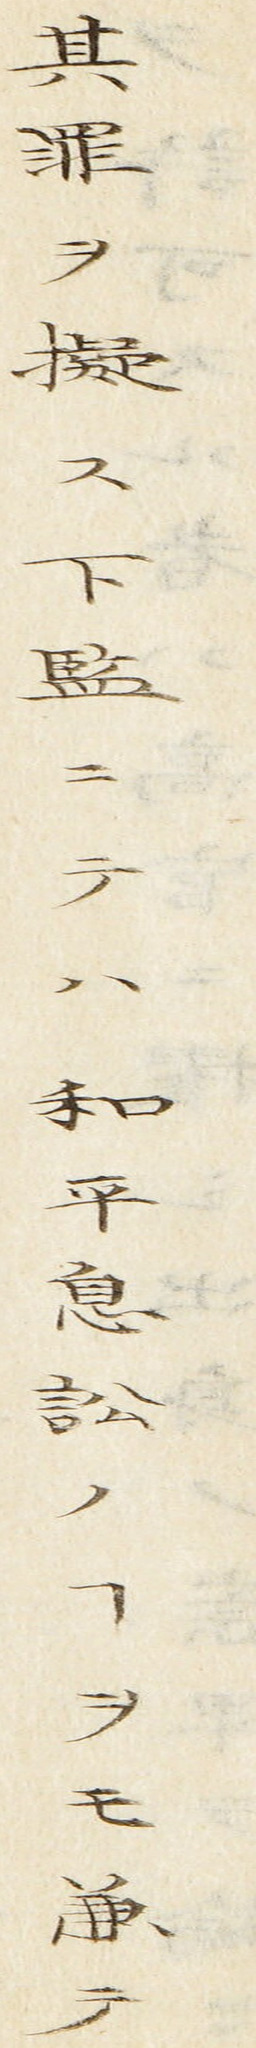其罪ヲ擬ス下監ニテハ和平息訟ノコトヲモ兼テ
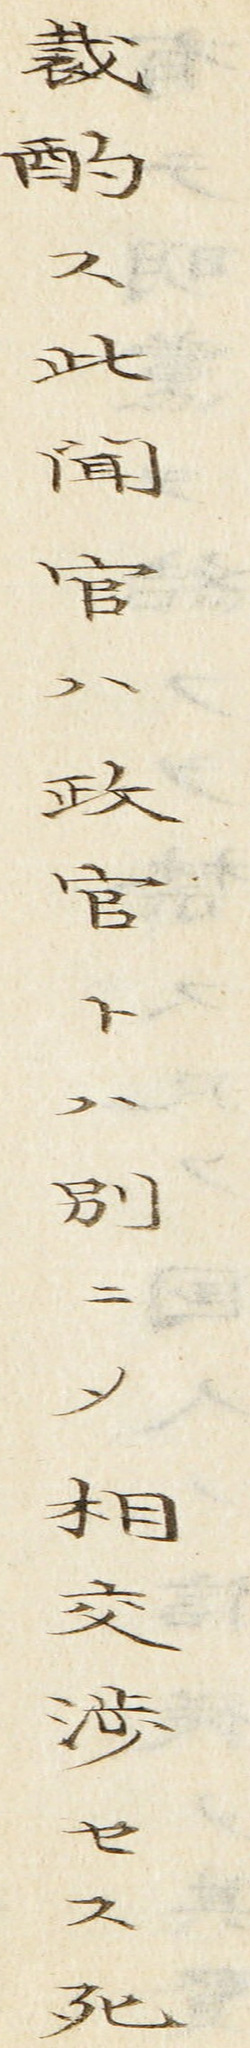裁酌ス此聞官ハ政官トハ別ニシテ相交渉セス死
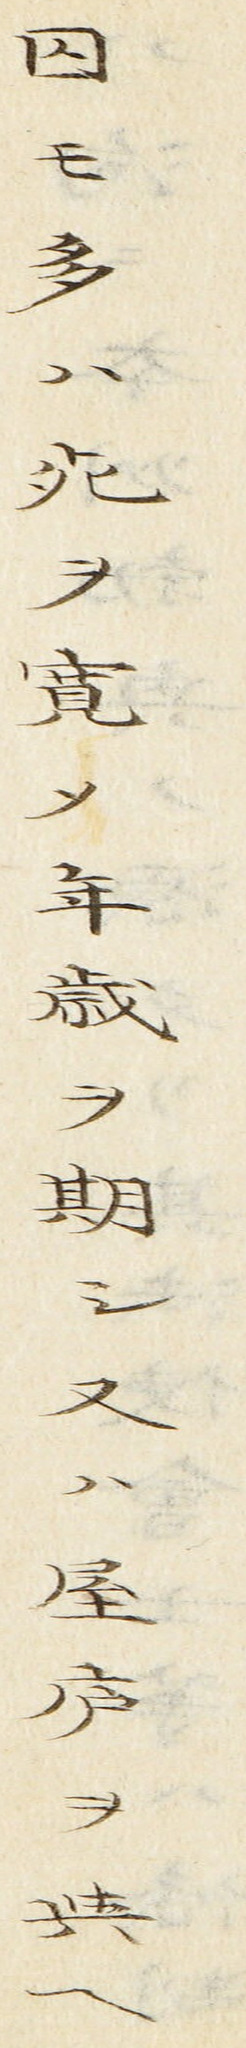因モ多ハ死ヲ寛シテ年歳ヲ期シ又ハ屋ヲ與へ
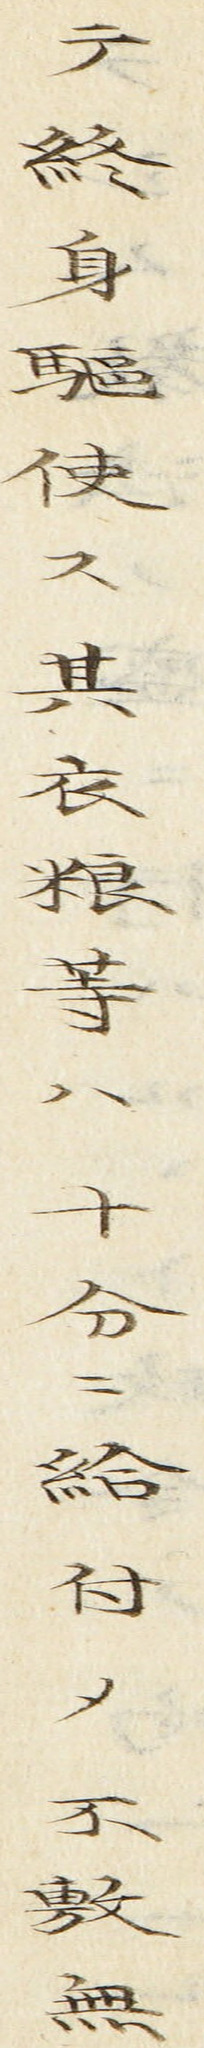テ終身驅使ス其衣粮等ハ十分ニ給付シテ不敷無

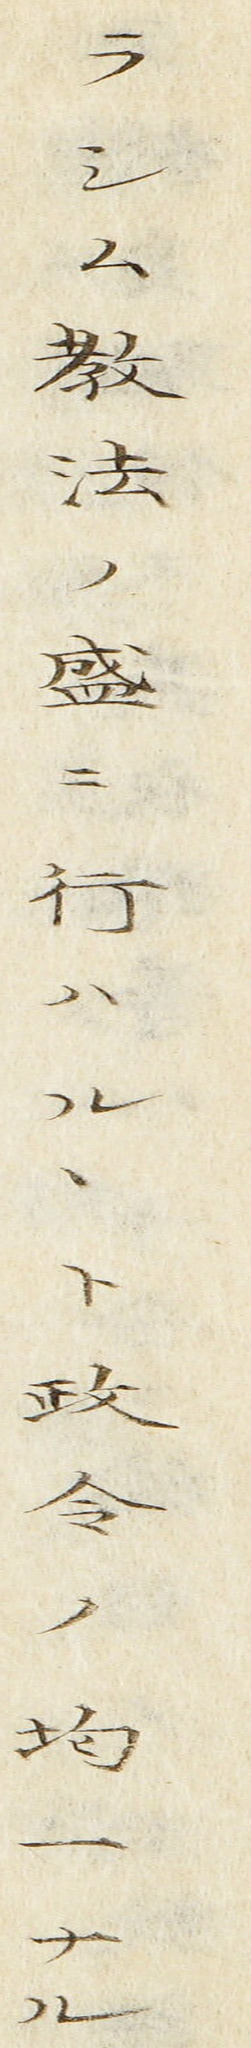ラシム教法ノ盛ニ行ハルヽト政令ノ均一ナル
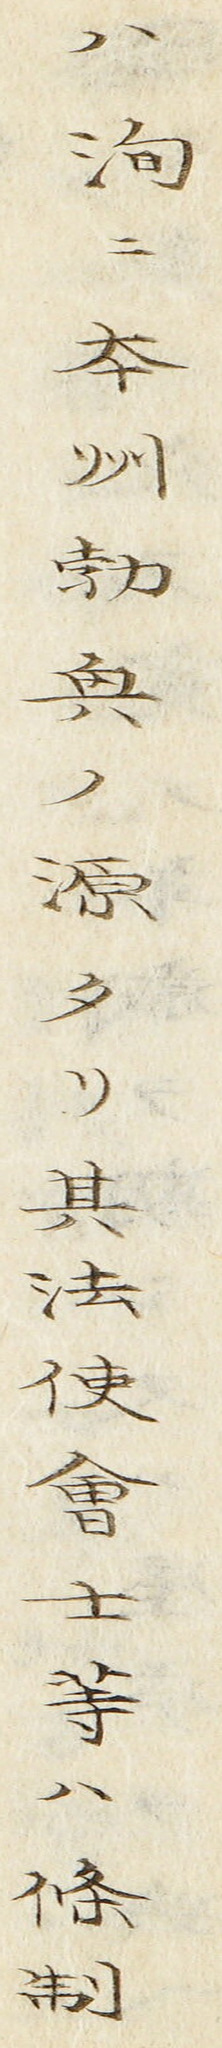ハ洵ニ本州勃興ノ源タリ其法使會士等ハ條制
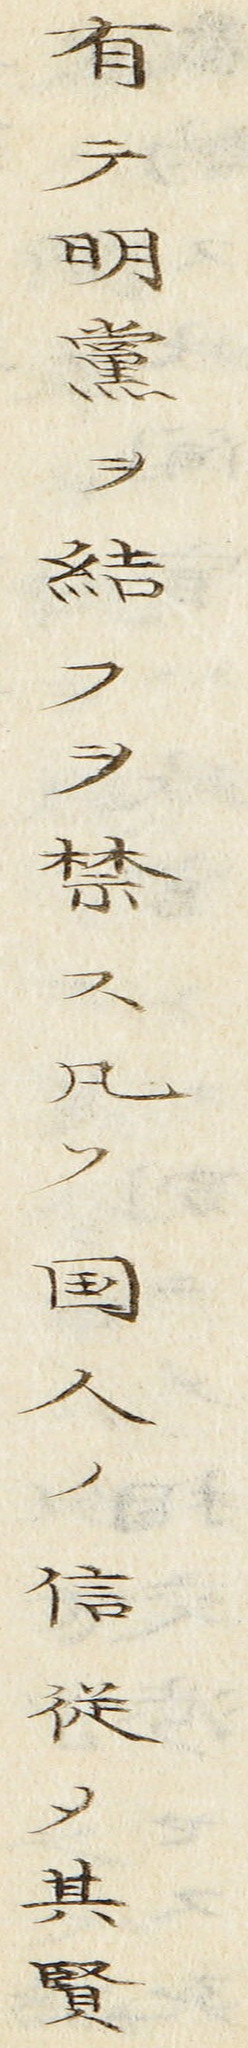有テ明黨ヲ結フヲ禁ス凡ソ国人ノ信従シテ其賢
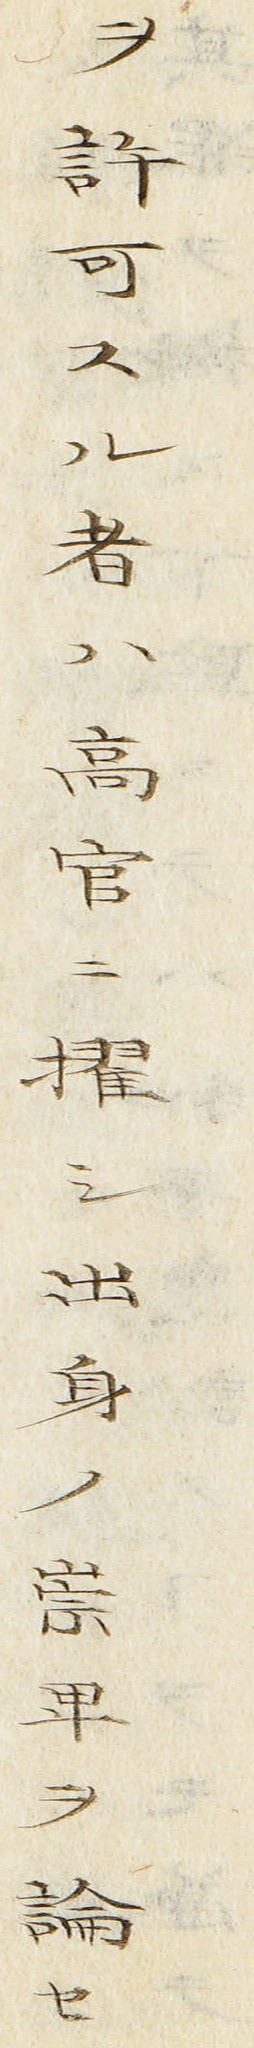ヲ許可スル者ハ高官ニ擢シ出身ノ崇卑ヲ論セ
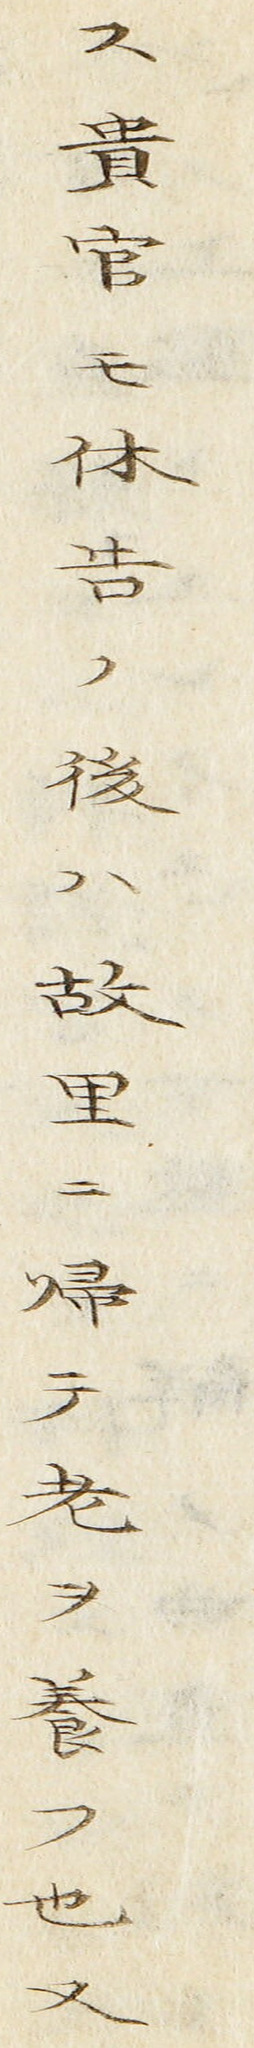ス貴官モ休告ノ後ハ故里ニ帰テ老ヲ養フ也又
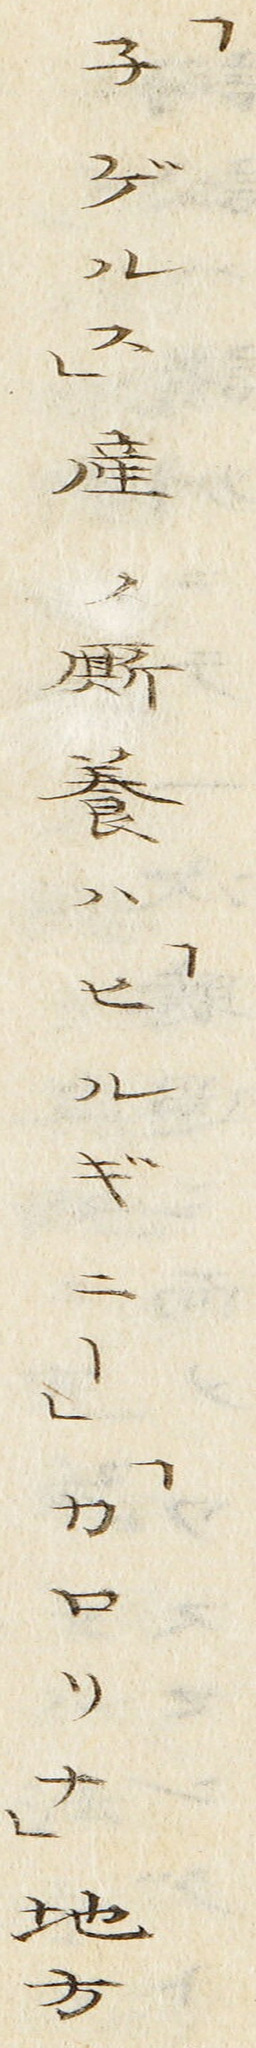「ネゲルス」産ノ厮養ハ「ヒルギニー」「カロリナ」地方
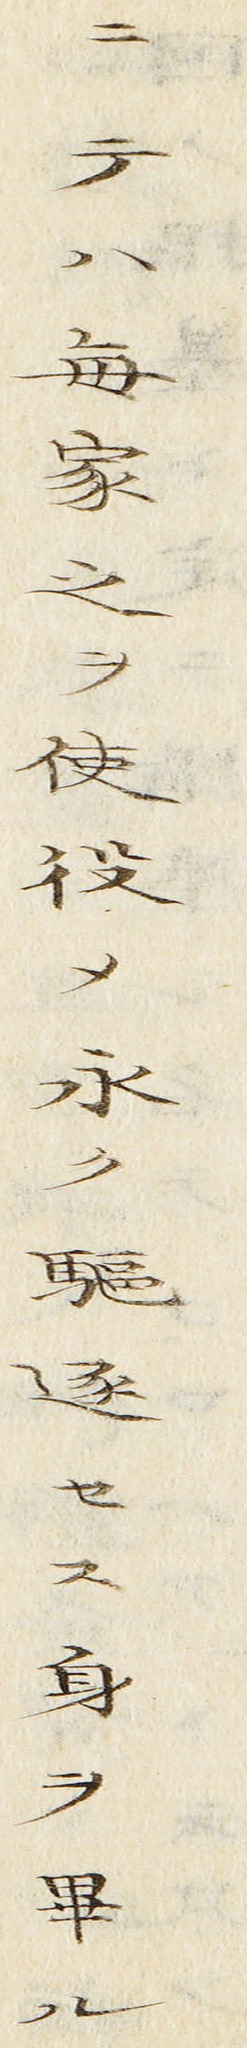ニテハ毎家之ヲ使役シテ永ク驅逐セス身ヲ畢ル
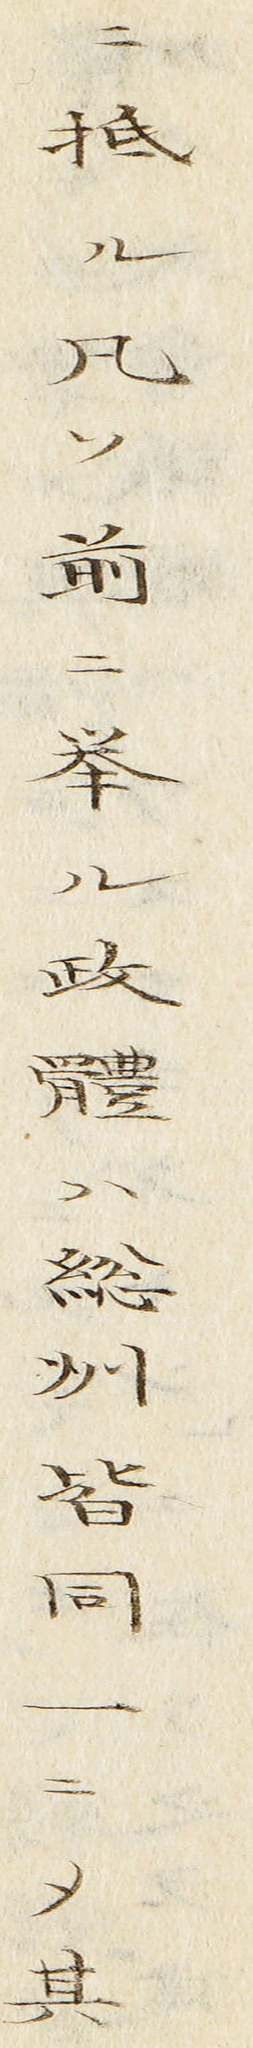ニ抵ル凡ソ前ニ挙ル政體ハ総州皆同一ニシテ其
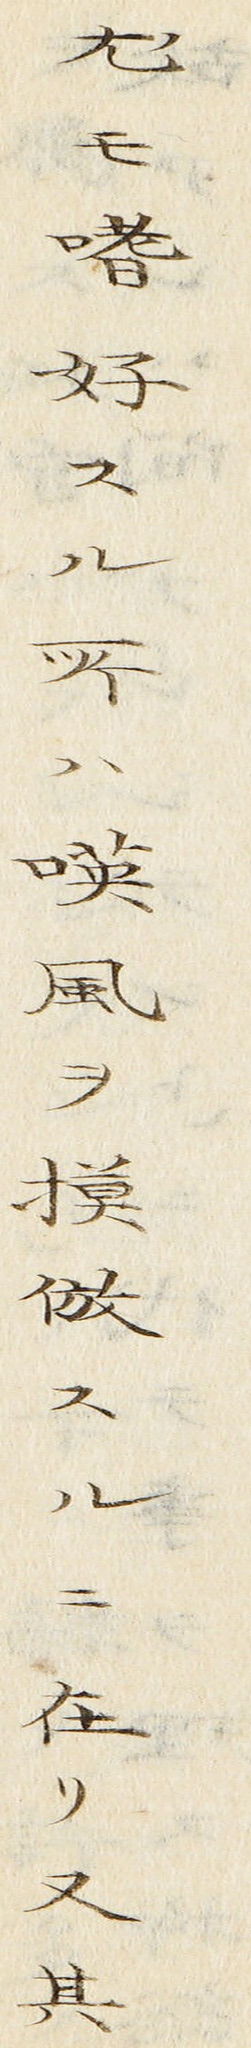尤モ嗜好スル所ハ風ヲ模倣スルニ在リ又其
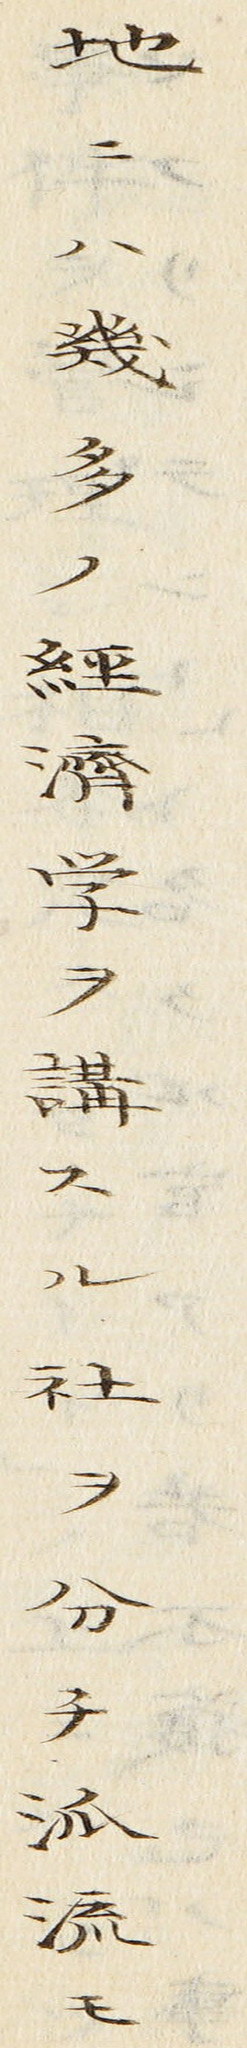地ニハ幾多ノ経済学ヲ講スル社ヲ分テ派流モ
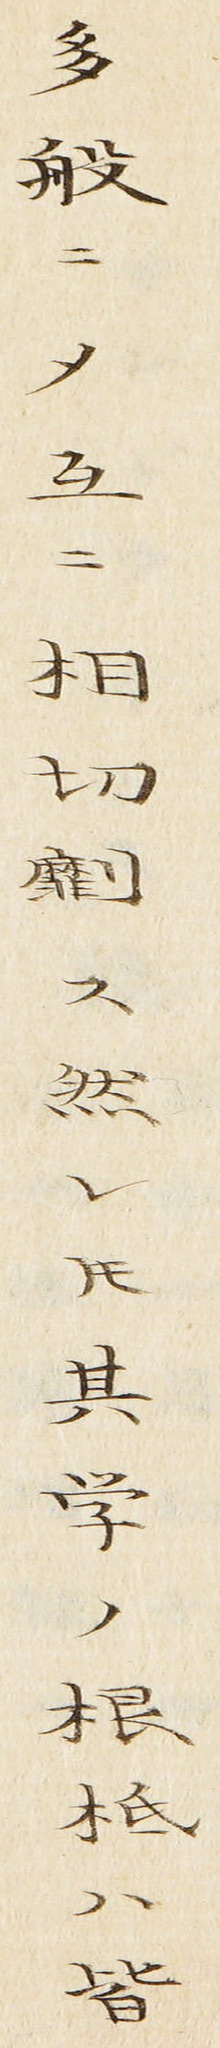多般ニシテ互ニ相切劘ス然レトモ其学ノ根柢ハ皆
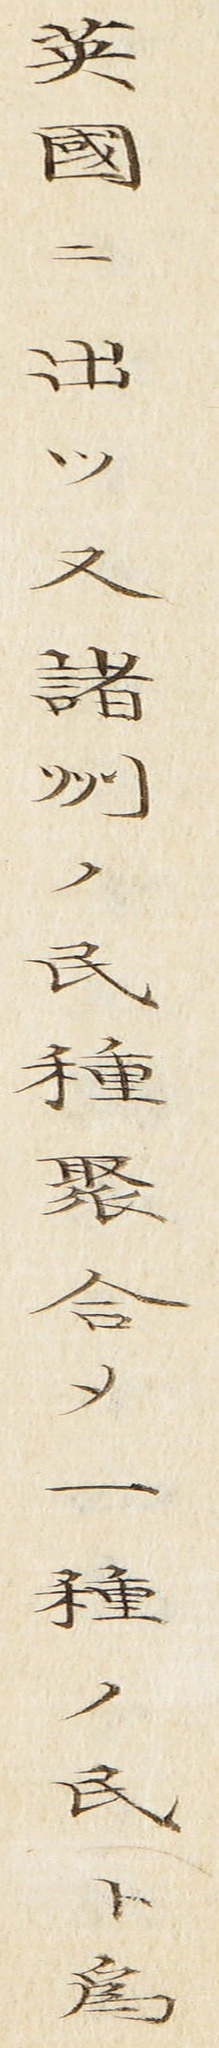英国ニ出ツ又諸州ノ民種聚合シテ一種ノ民ト為
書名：蕃談
